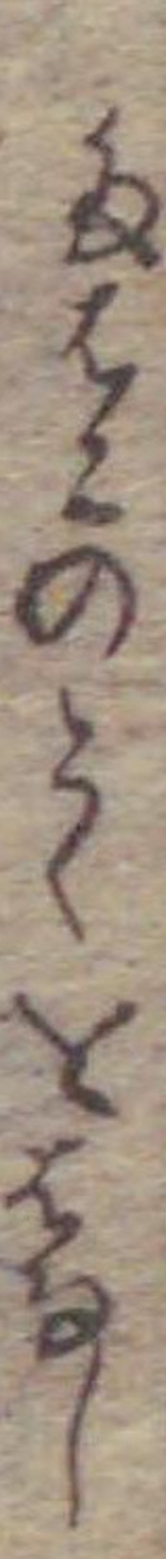たはこのとくをはなし
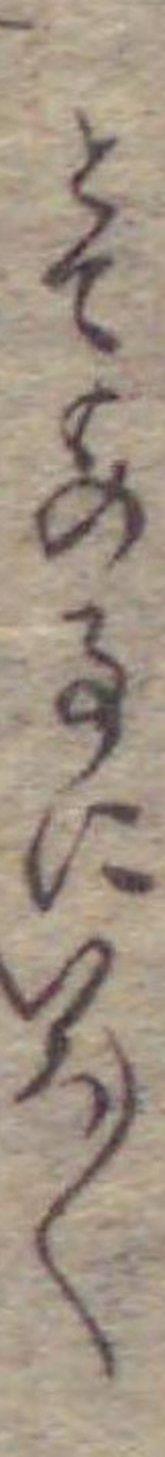とてもの事にいろ〳〵
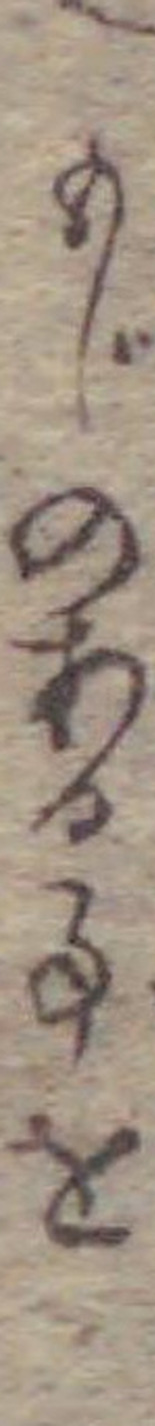もじのある事を
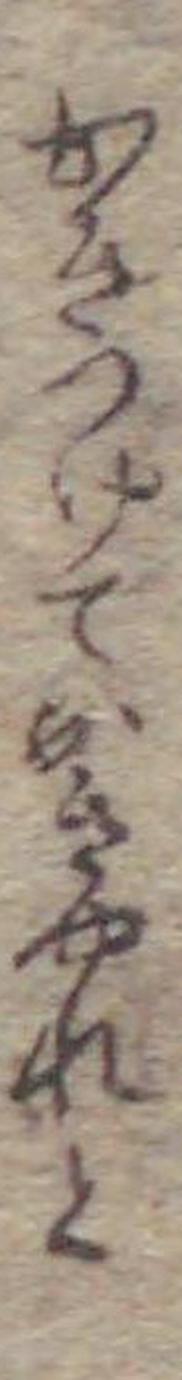かきつけておきゆれと
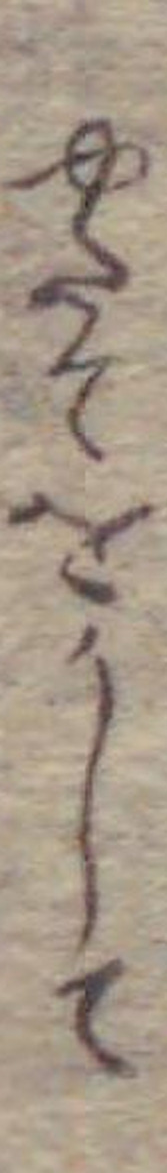やたてをかして
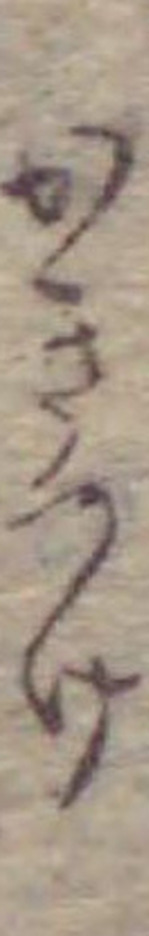かきつけ
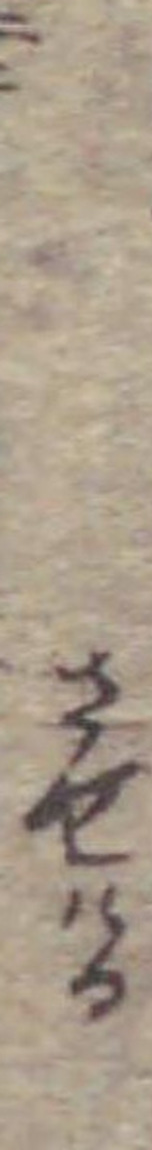させける
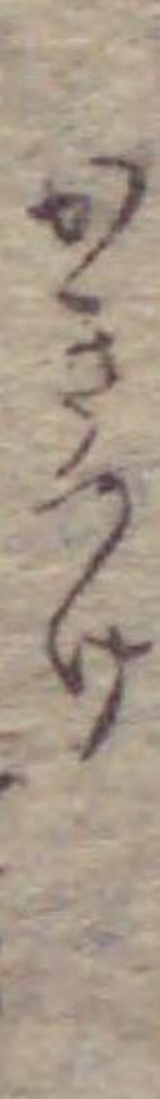かきつけ
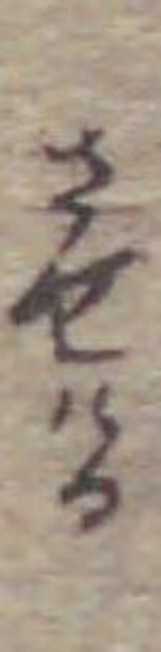させける
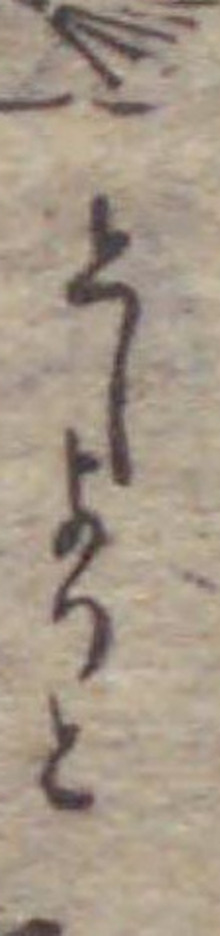としよりと
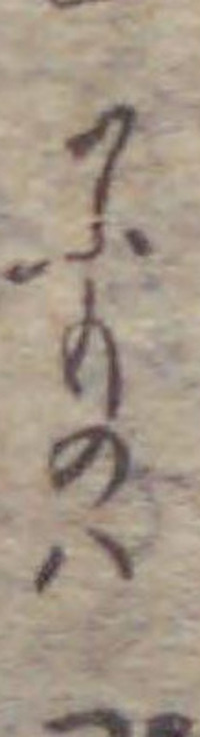いふものは
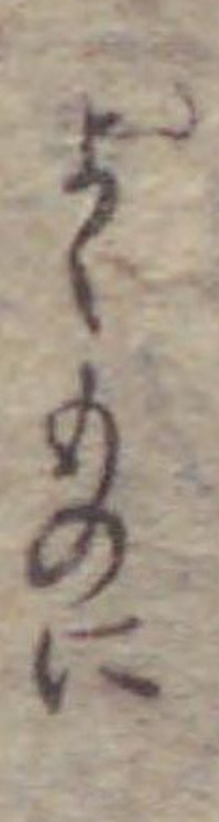よくものに
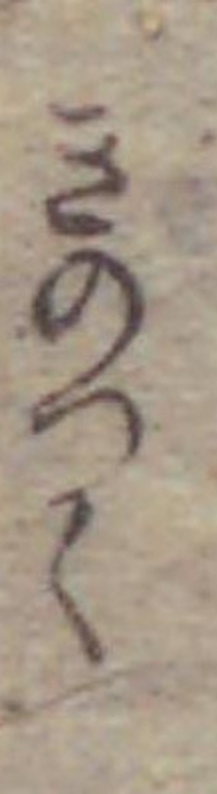きのつく
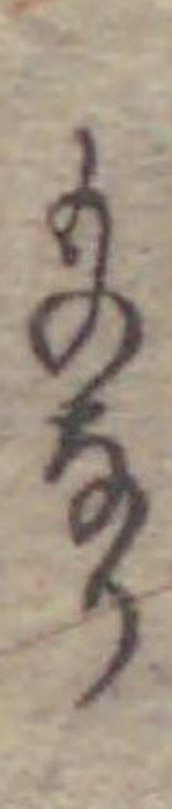ものなり
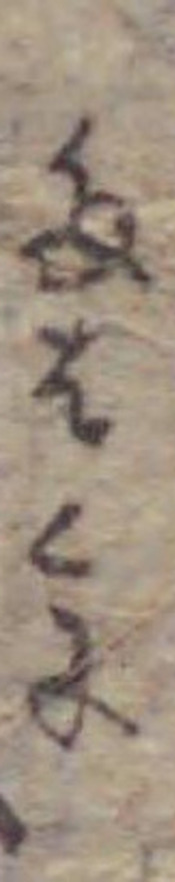たはくに
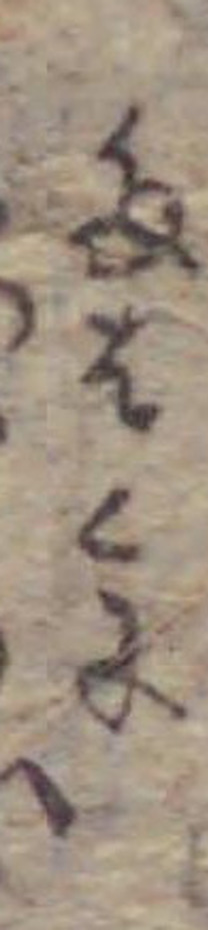たはくに
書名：談芭菰誉詞 : 3巻
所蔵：国立国会図書館 National Diet Library, JAPAN
